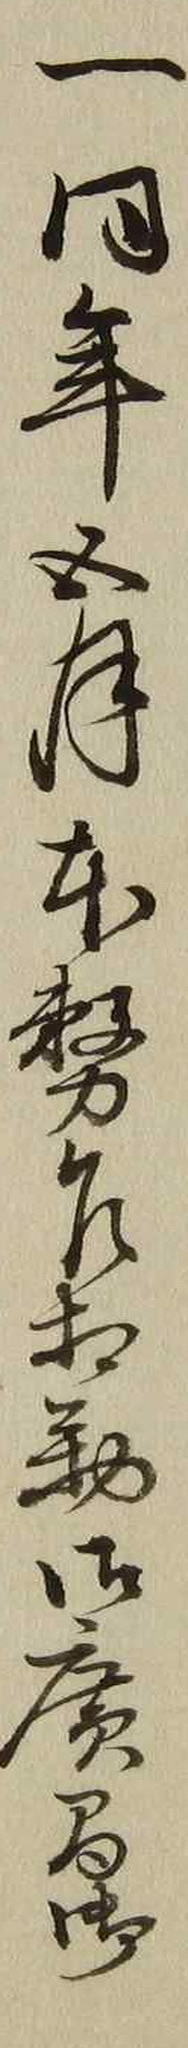一同年五月本務乍相勤御広間御
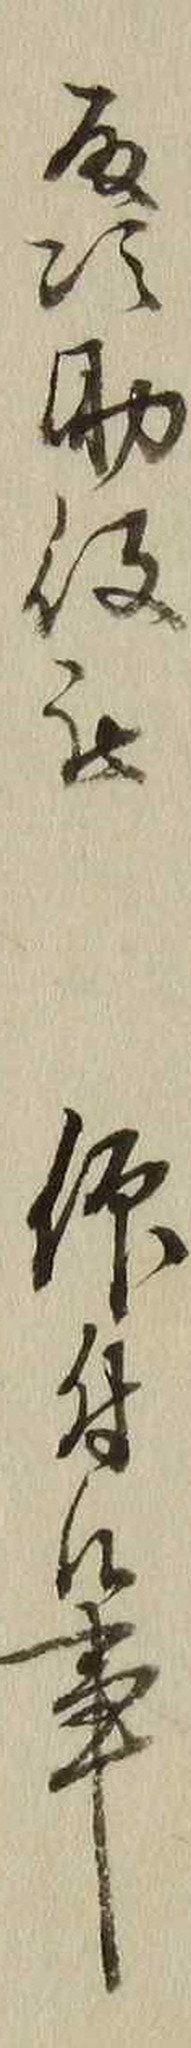取次助役被仰付候事
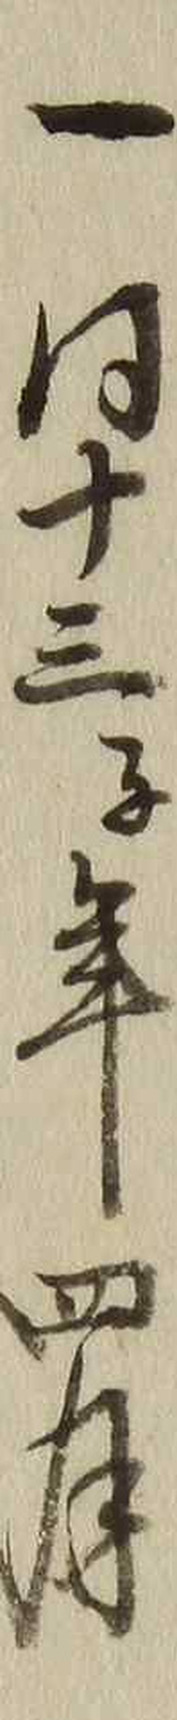一同十三子年四月
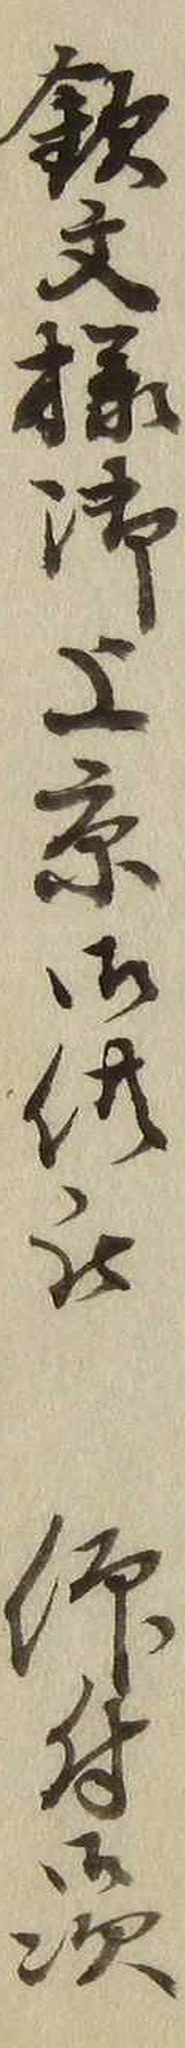欽文様御上京御供被仰付御次
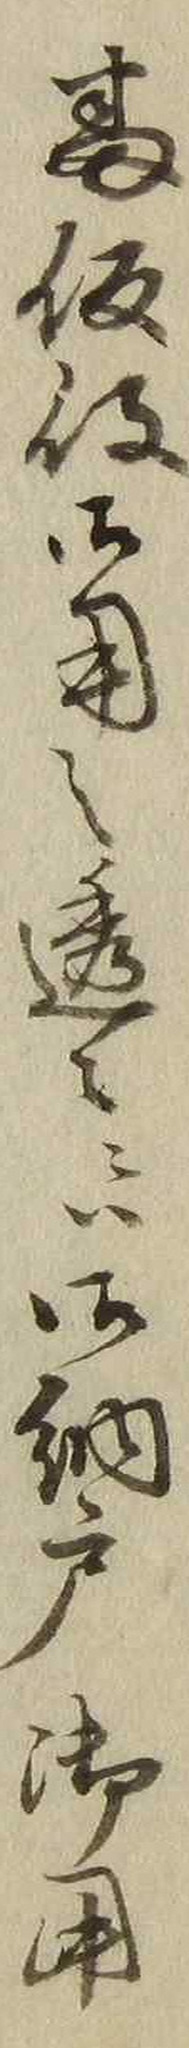番仮役御用之透々ニハ御納戸御用
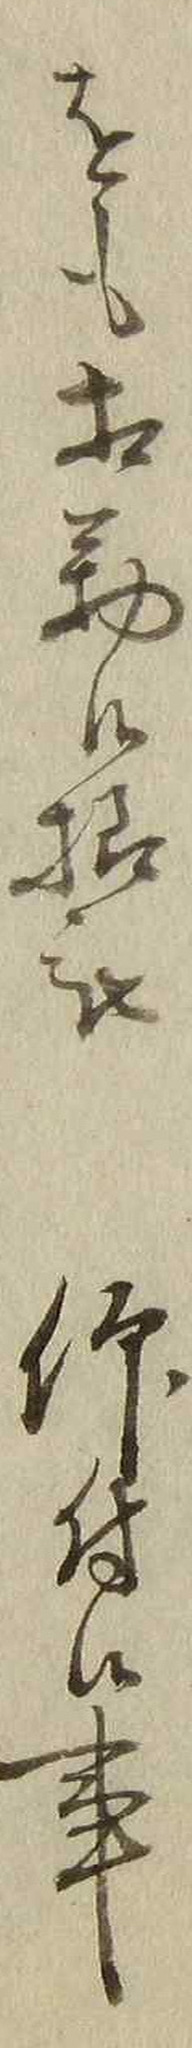をも相勤候様被仰付候事
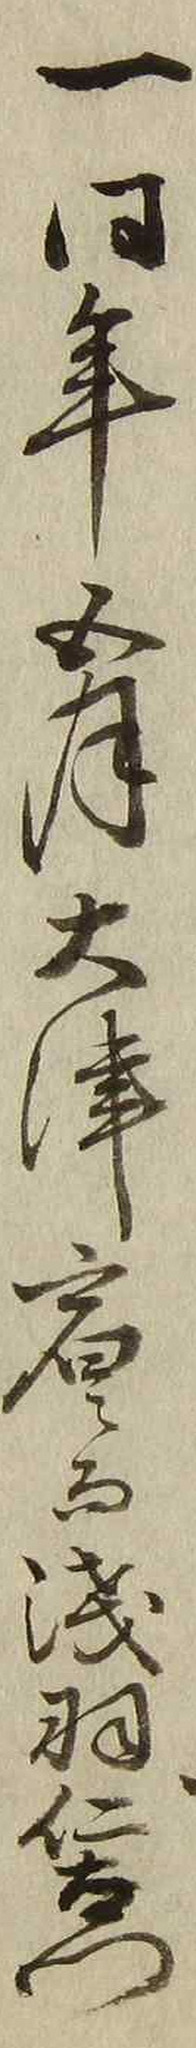一同年五月大津宿ニ而浅羽仁右衛門
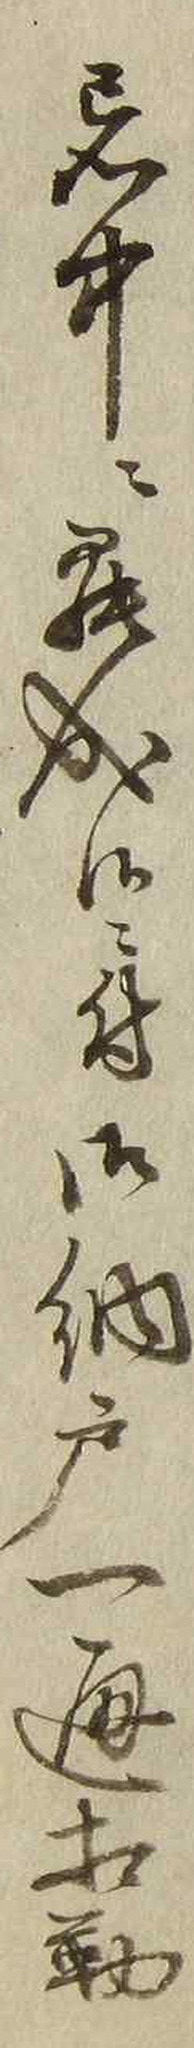忌中ニ罷成候ニ付御納戸一通相勤
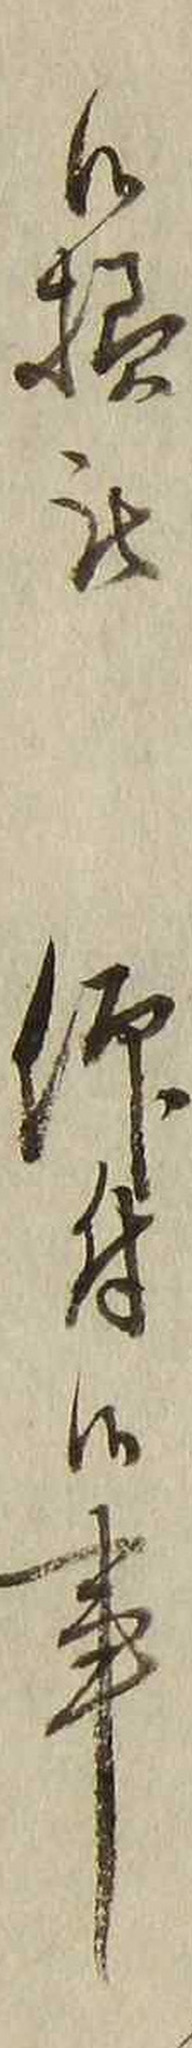候様被仰付候事
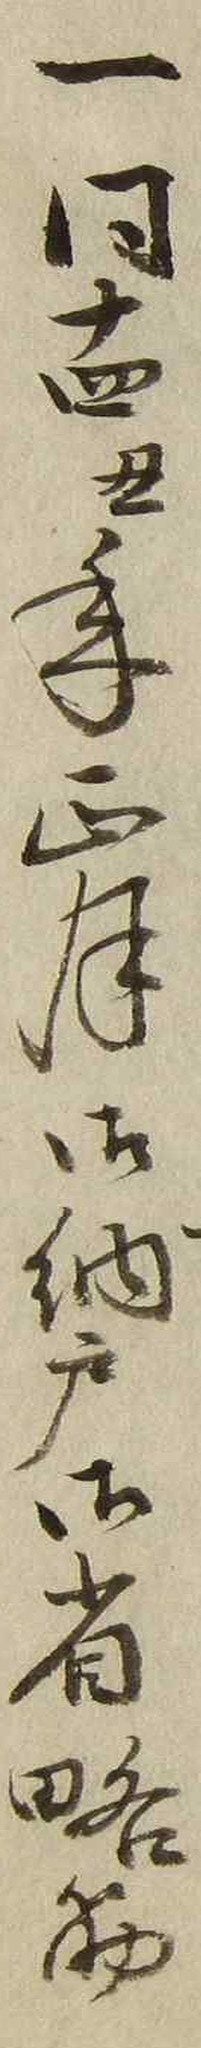一同十四丑年正月御納戸御省略筋

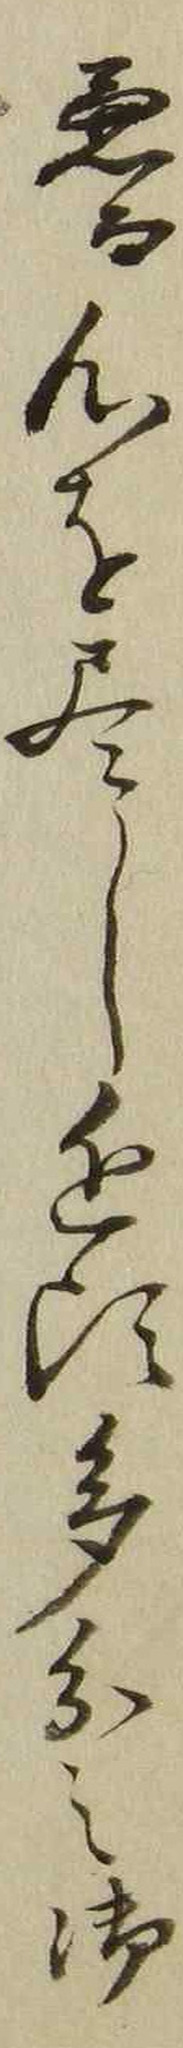惣而心を尽し近頃多分之御
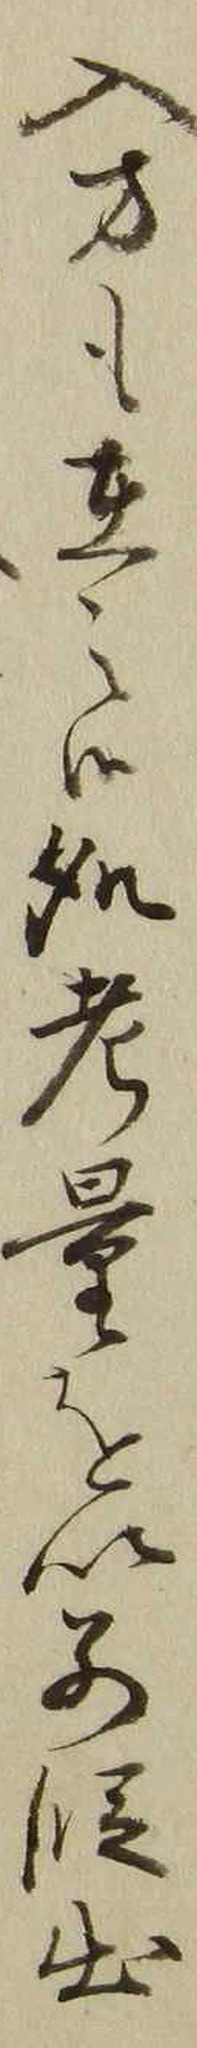入方も在之候処考量を以別段出
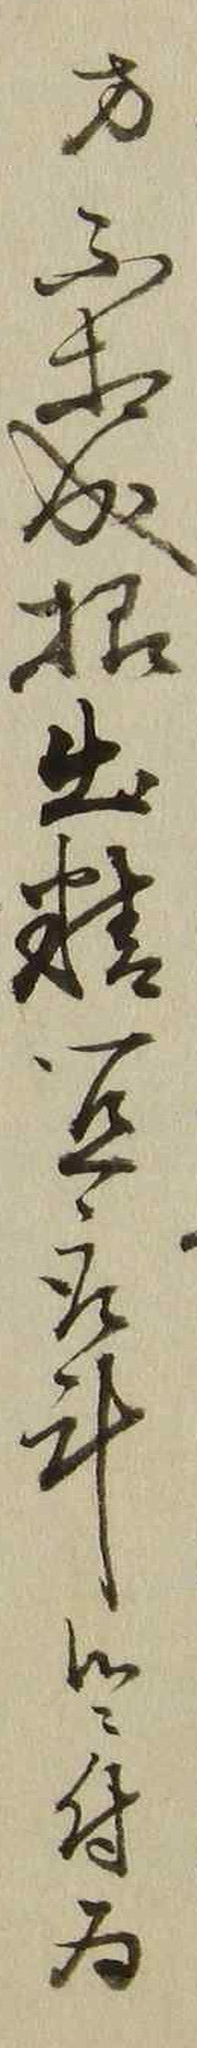方不相成様出精宜取計候ニ付為
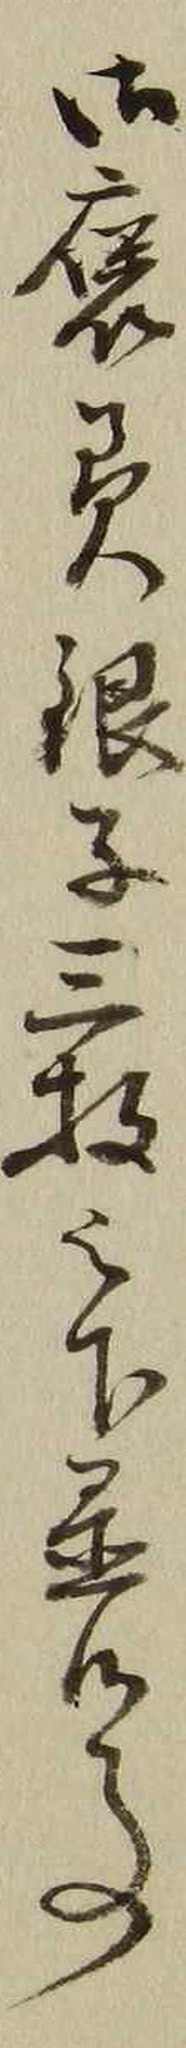御褒美銀子三枚被下置候事
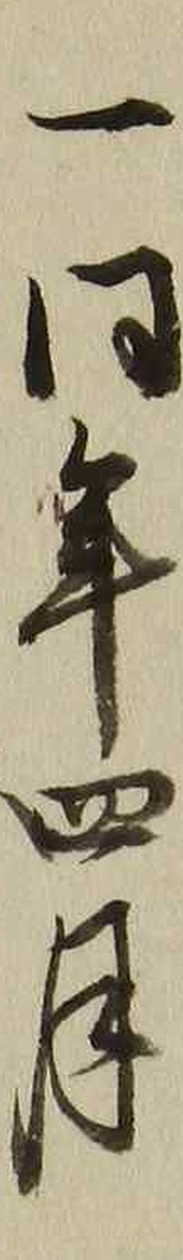一同年四月
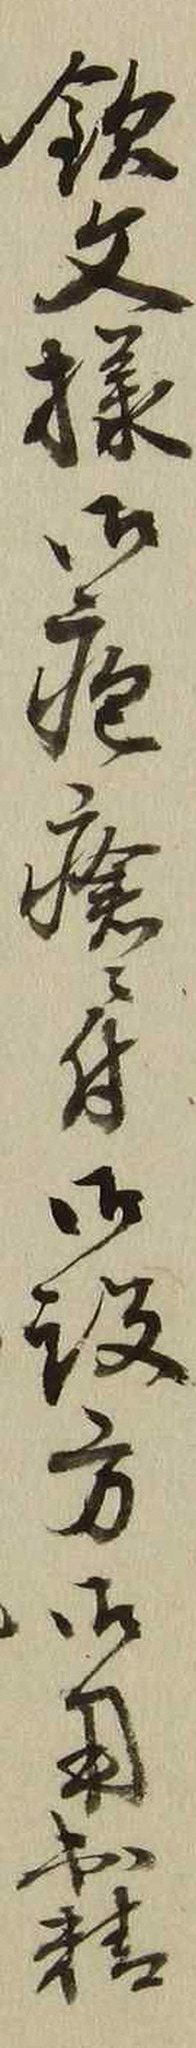欽文様御疱瘡ニ付御設方御用出精
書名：諸士系譜　巻之35　は之部3
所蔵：会津若松市立会津図書館
